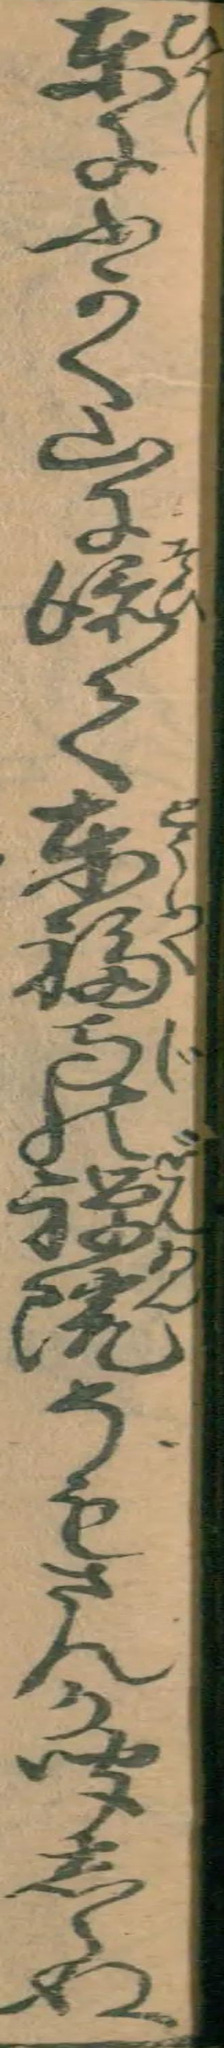東にふかく山に添て東福寺の禅院そもさんか聞しらぬ
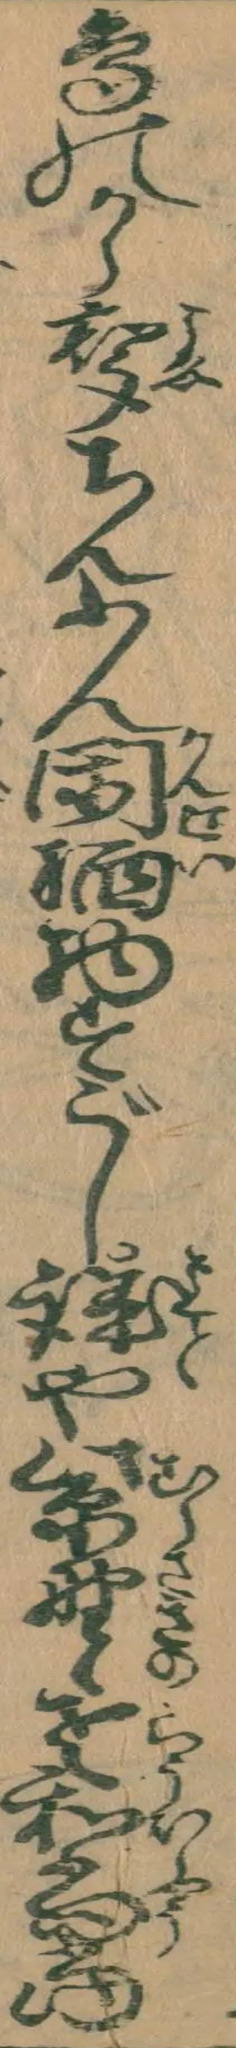鳥のから声ちんふん閑栖物すごし。誠や紫野老和尚当
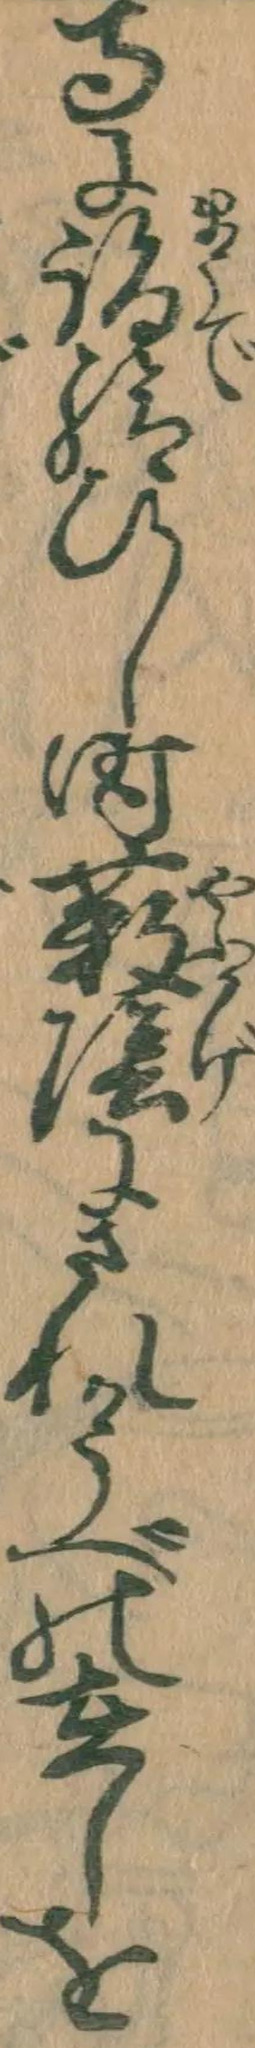寺に詣給ひし時薮陰にされかうべの在しを
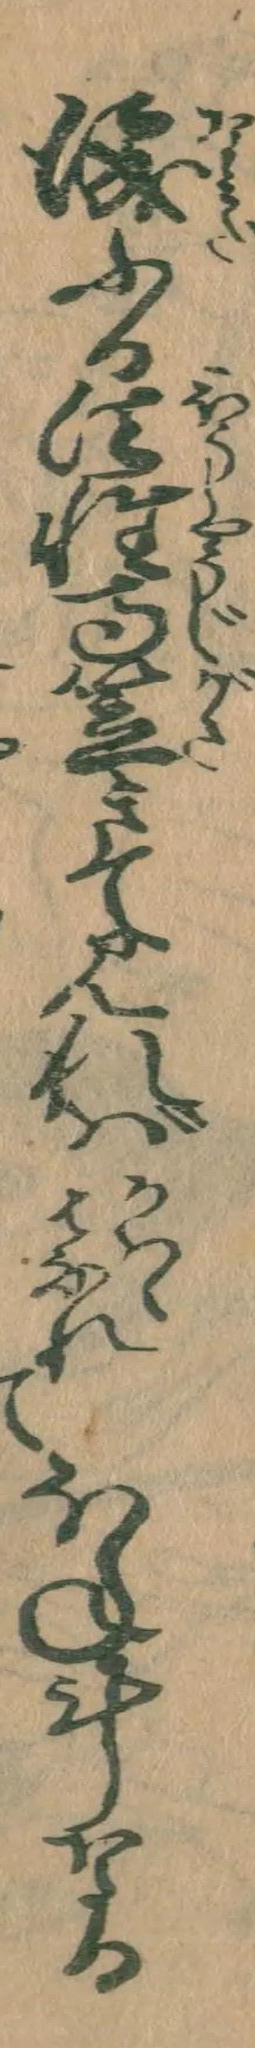涙ふる法性寺笠きて見ればかはゝはなれてほね計なる
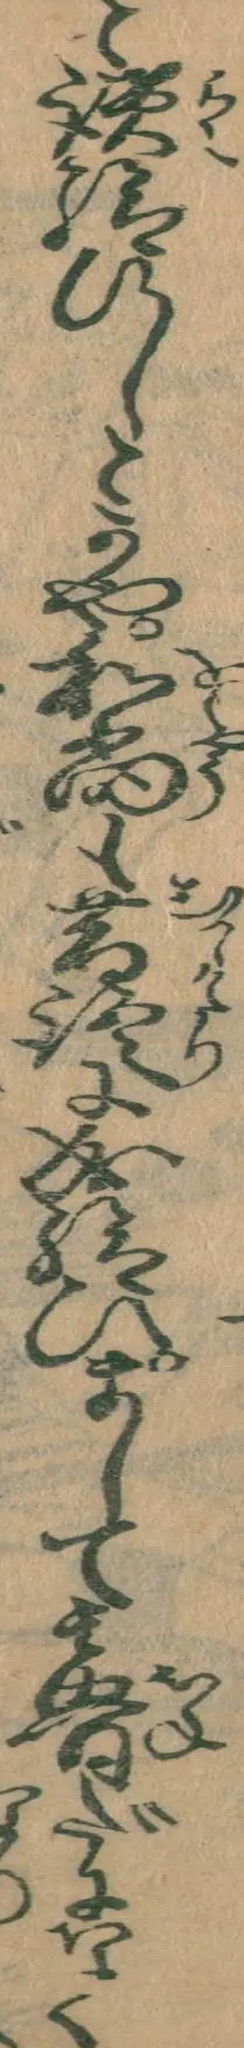と読給ひしとかや。和尚も昔語に成給ひ。まして其骨だになくなりし
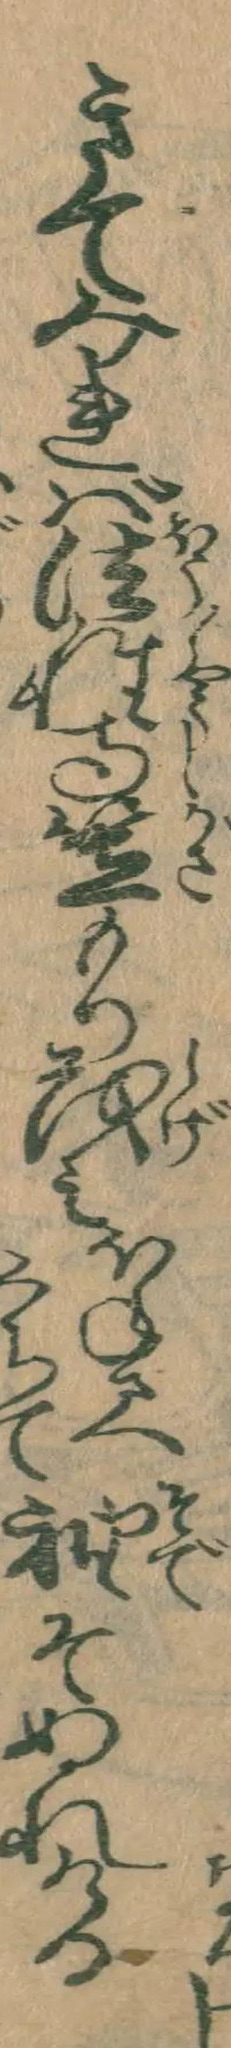きてみれば法性寺笠もり茂みほねさへくちて袖そぬれける
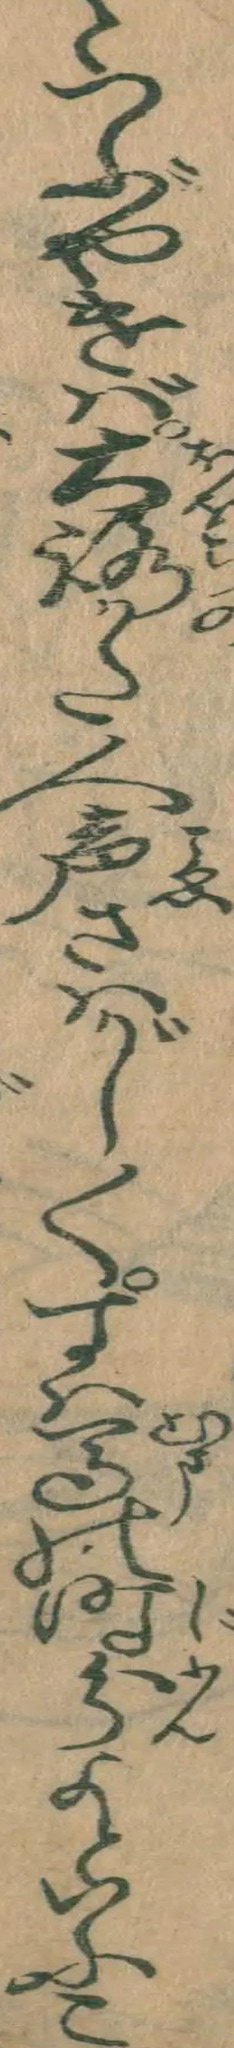とつぶやけば。大路かた人声さはがし〱。すは馬の時分よといふこ
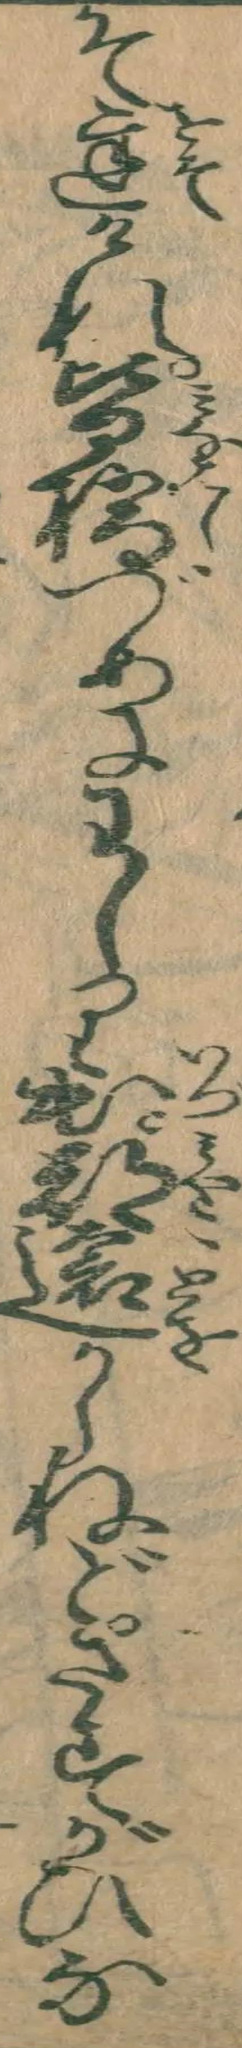そ遅けれ。皆橋づめにわしり出。都遠からねど。さすがひな
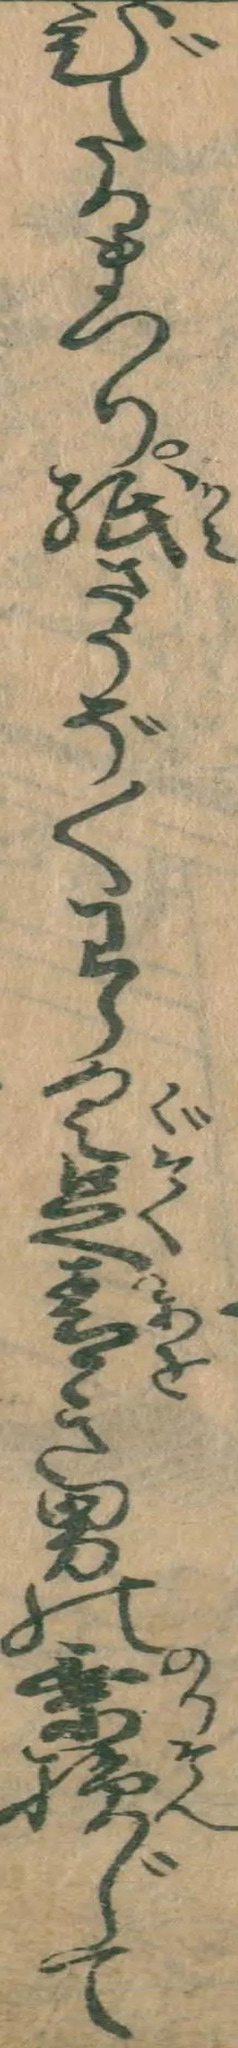びたるまつり。紙さうぞくわら具足。青き男の乗損じて
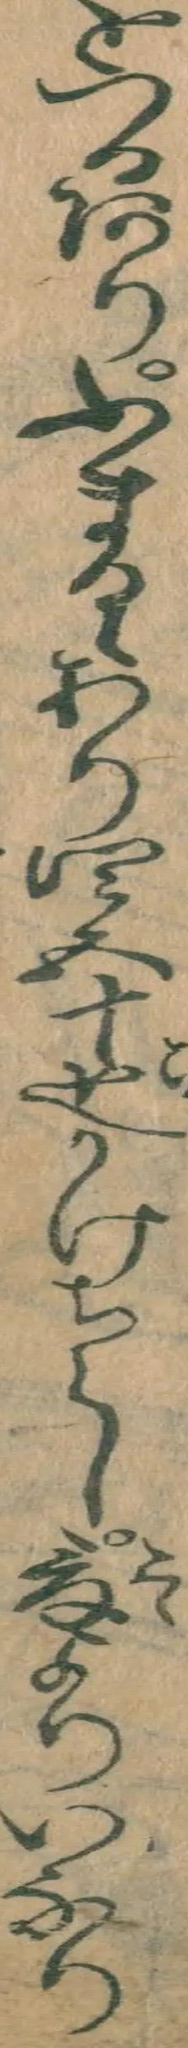をつるあり。ふまるゝあり四五十疋かけちらし。爰よりいなり
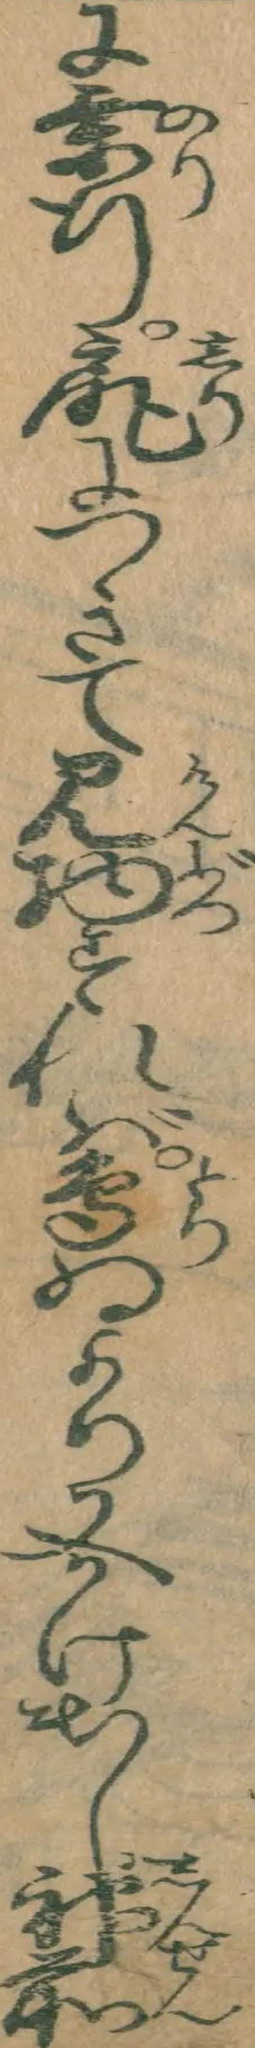に乗行。尻につきて見物すれば。鳥ゐより又かけ出し神前

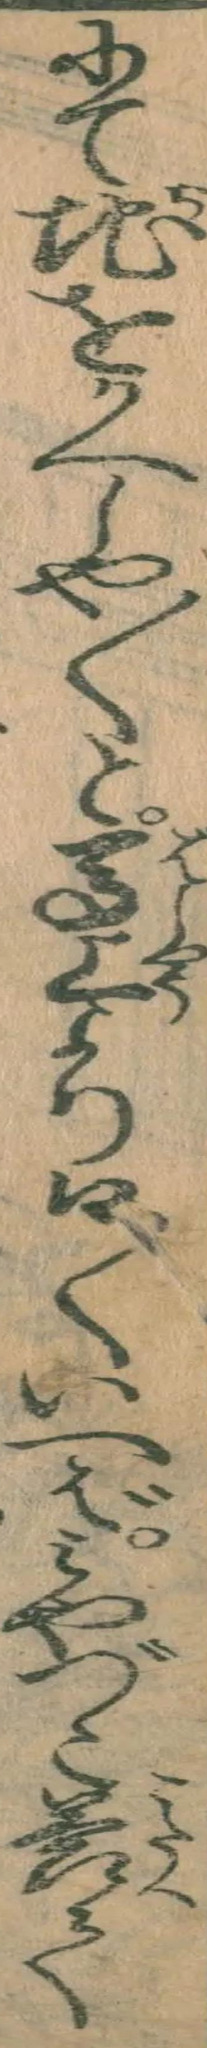にて地をかへしや〳〵と。馬上より口々いへば。みやづこ答て
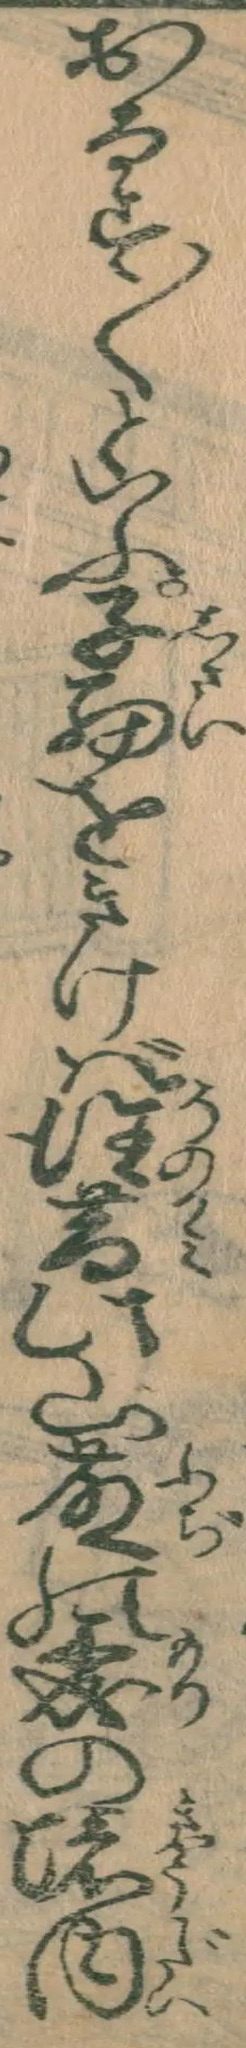おるす〳〵といふ。子細をきけば往昔此山藤の森の境内
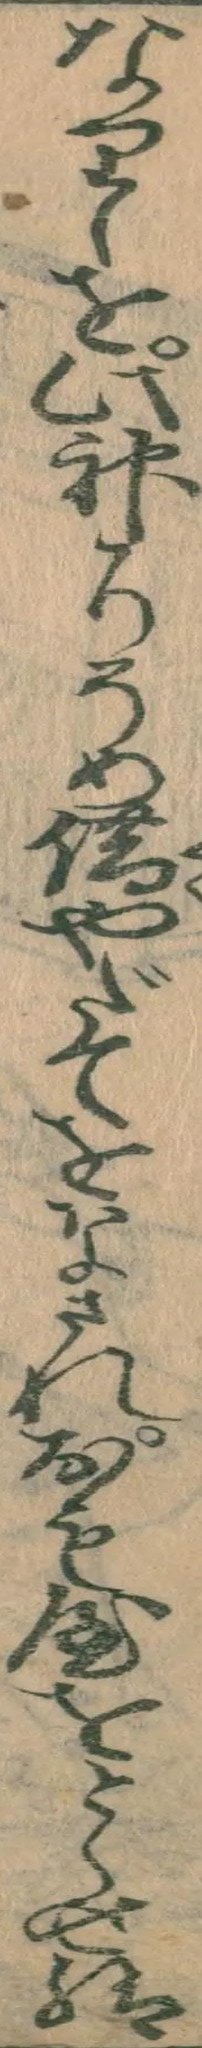なりしを。此神にそめ借やだてをなされ。おも屋をとらせ給
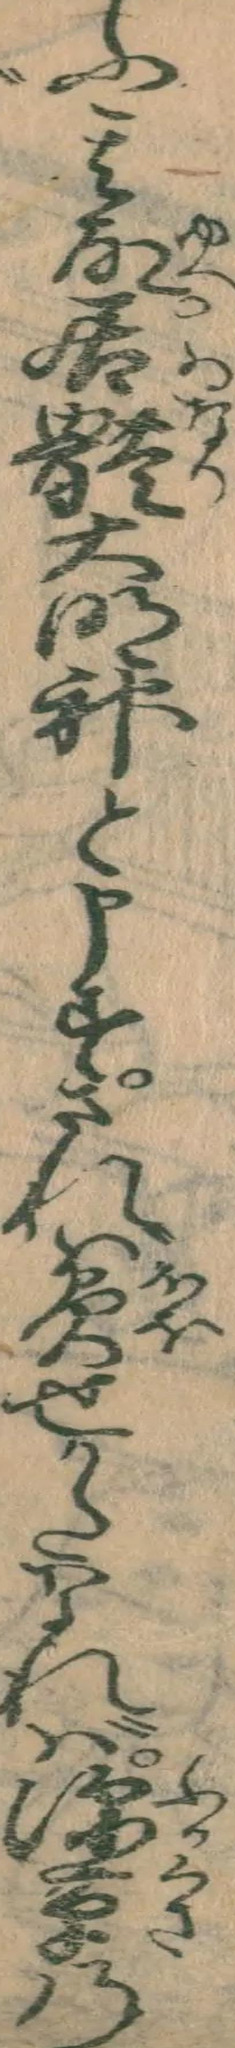ふ其故。居体大明神と申す。されば負せかたなれば。深草の
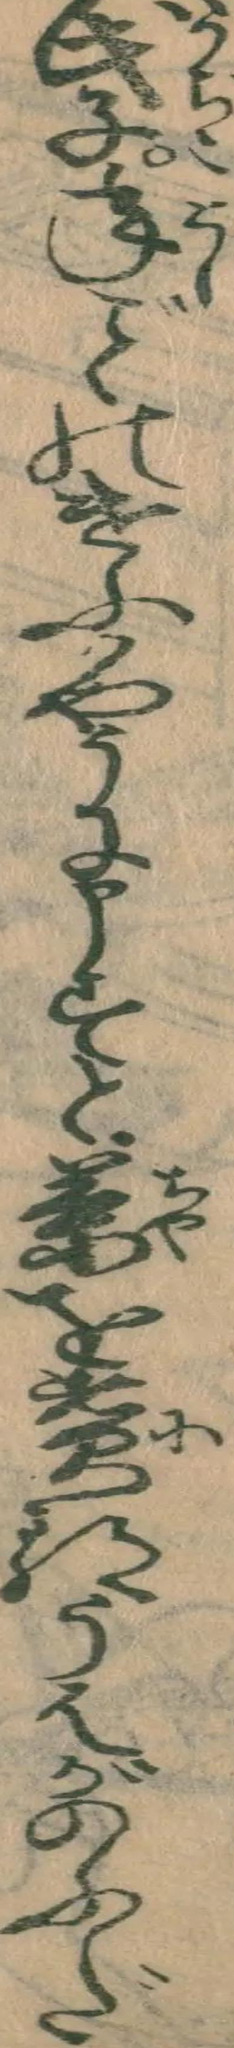氏子。年ごとのけふかやうに申すと。茶を煮るうはがのふだ
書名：新竹斎 5巻
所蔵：国立国会図書館 National Diet Library, JAPAN
